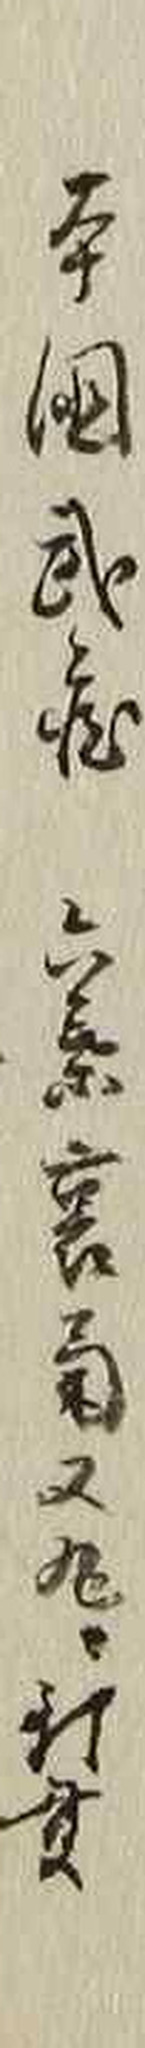本国武蔵六葉裏菊又丸ニ釘貫
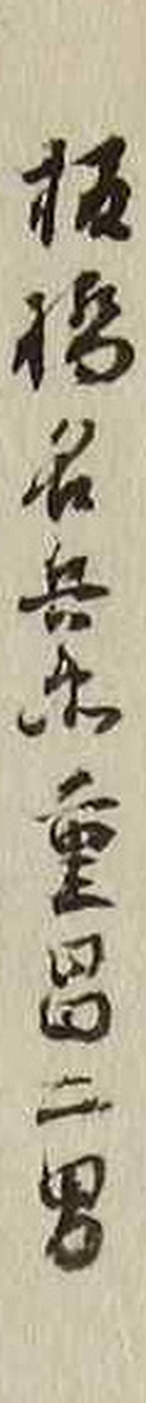板橋名兵衛重昌二男
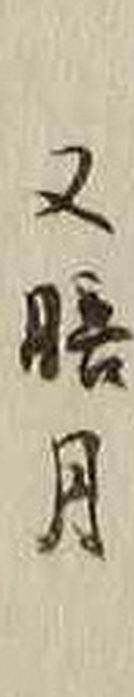又膳月
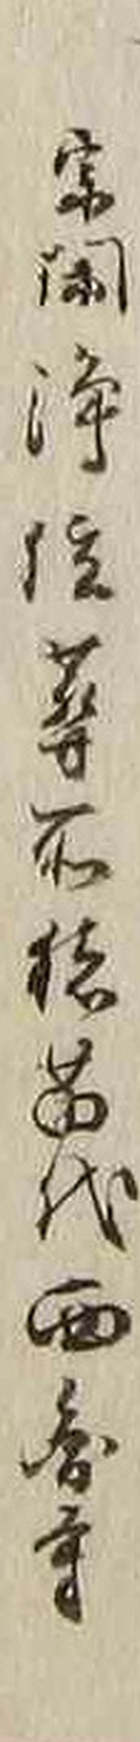宗閑浄信葬所猪苗代西円寺
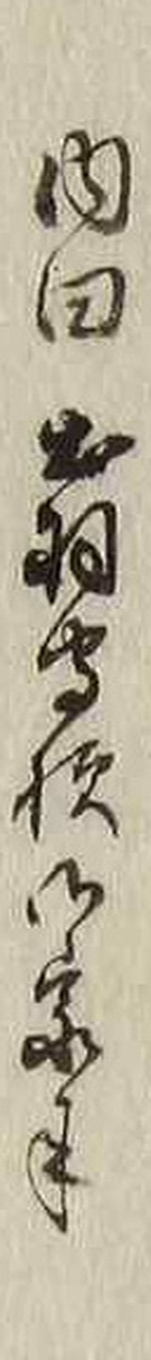内田出羽守様家来
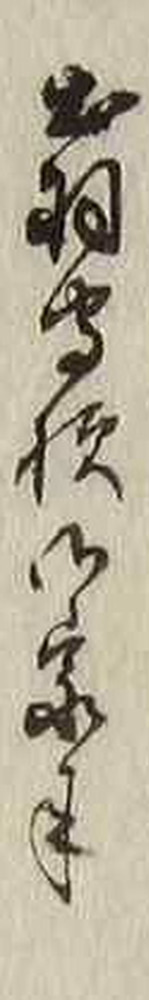内田出羽守様家来
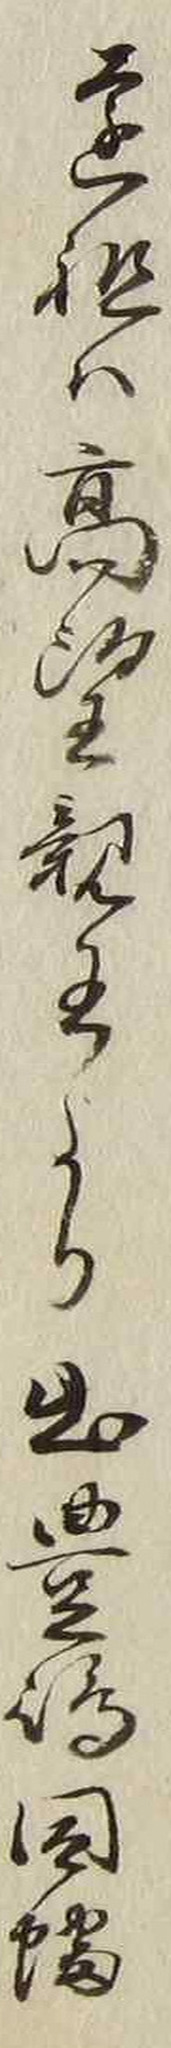遠祖ハ高望親王より出豊嶋因幡
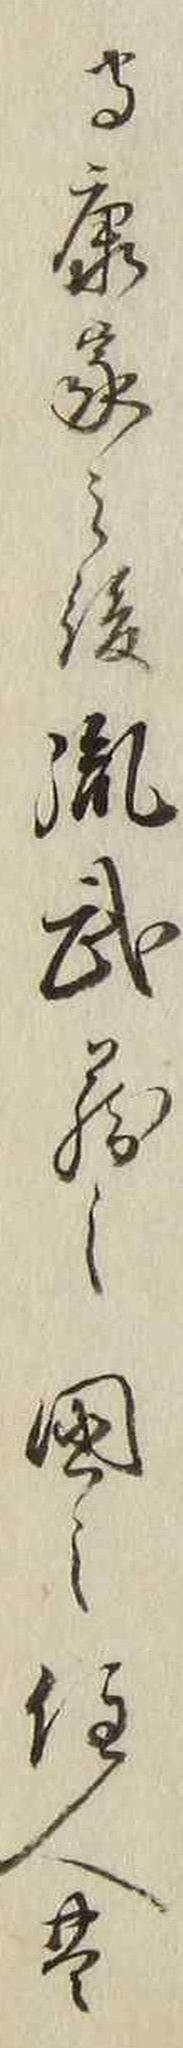守康家之後胤武蔵之国之住人豊

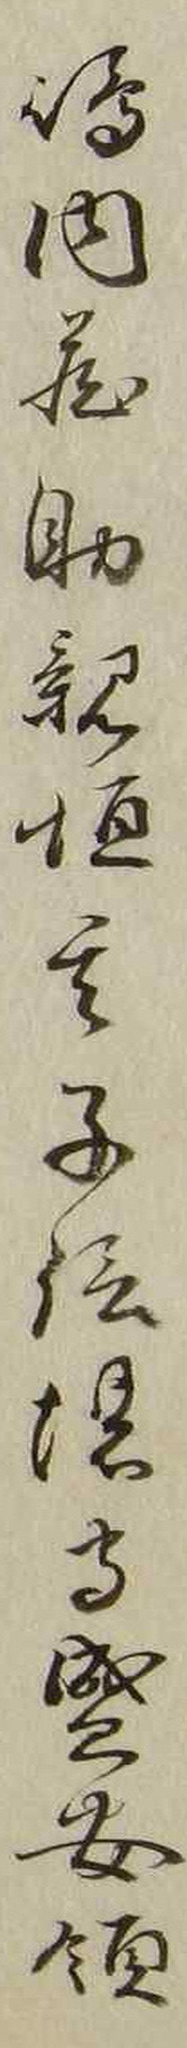嶋内蔵助親恒其子信濃守盛安領
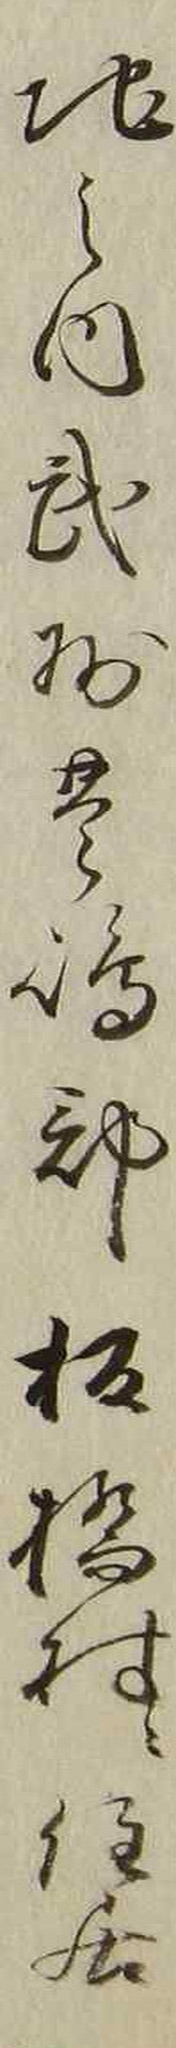地之内武州豊嶋郡板橋村ニ住居
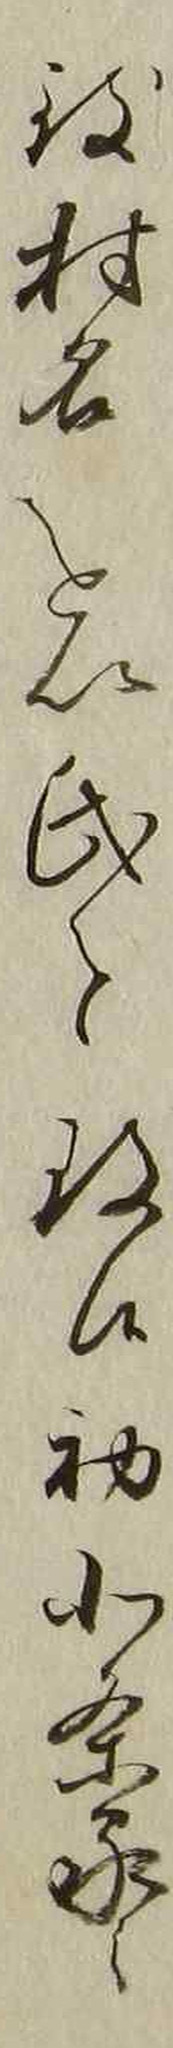致村名を以氏と致候初北条家之
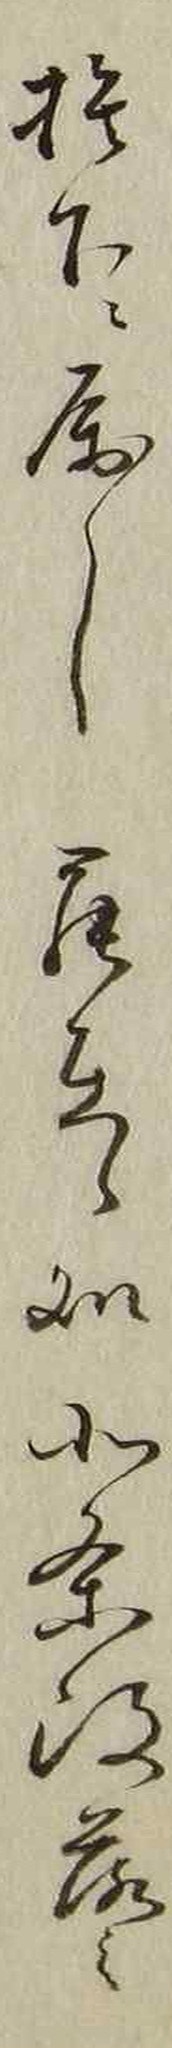旗下ニ属し罷在候処北条没落之
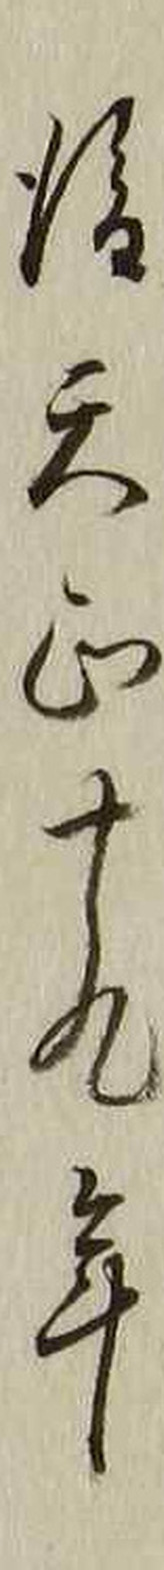後天正十九年
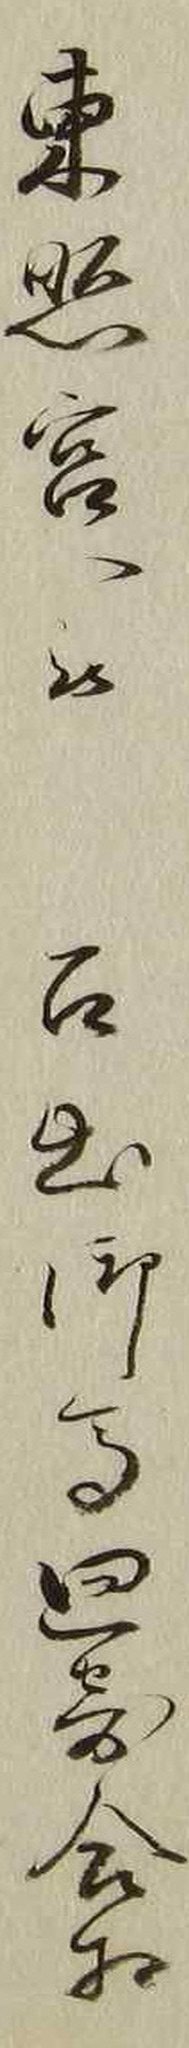東照宮へ被召出御馬廻寄合相
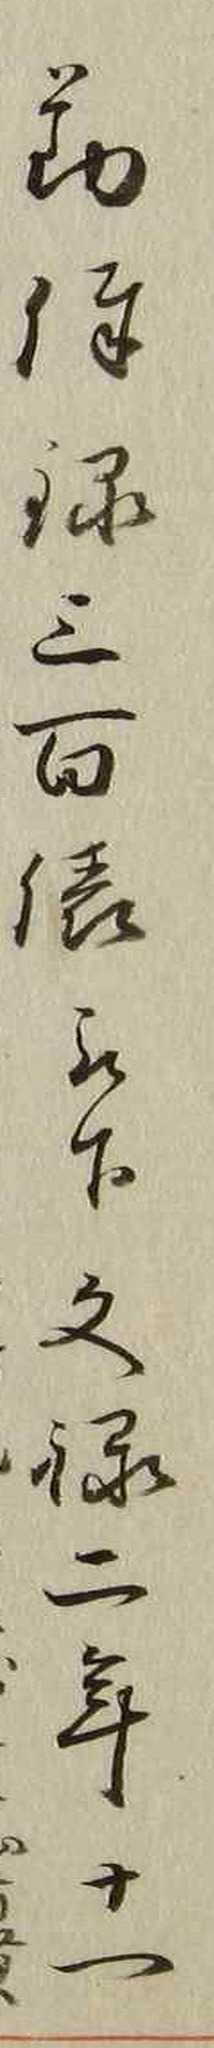勤俸録三百俵被下文禄二年十一
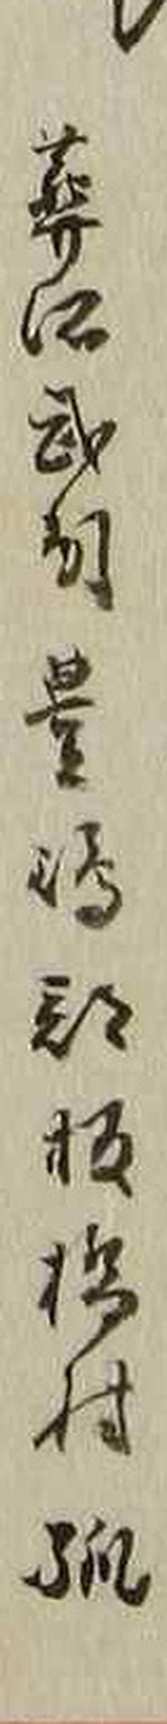葬所武州豊嶋郡板橋村孤
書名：諸士系譜　巻之4　い之部4
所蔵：会津若松市立会津図書館
